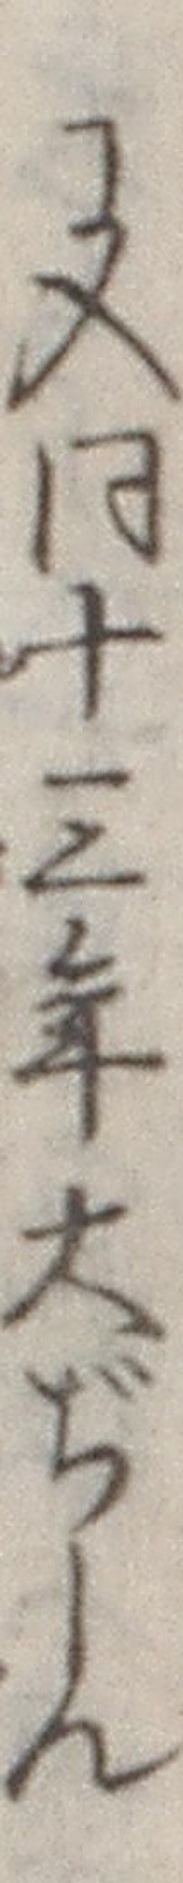に入同十三年大ぢしん
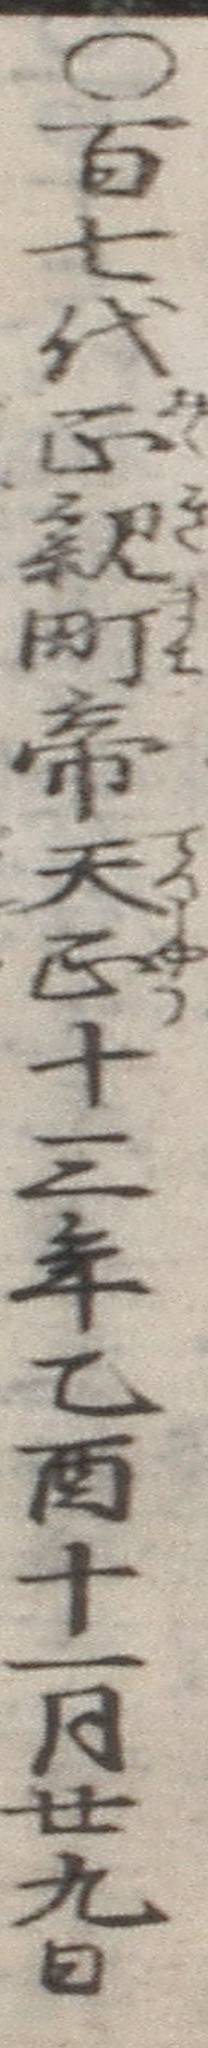○百七代正親町帝天正十三年乙酉十一月廿九日
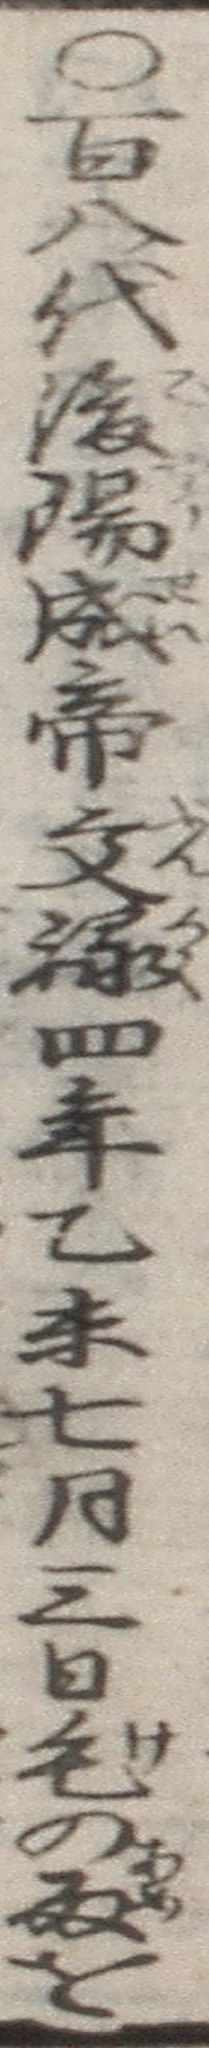○百八代後陽成帝文禄四年乙未七月三日毛の雨を
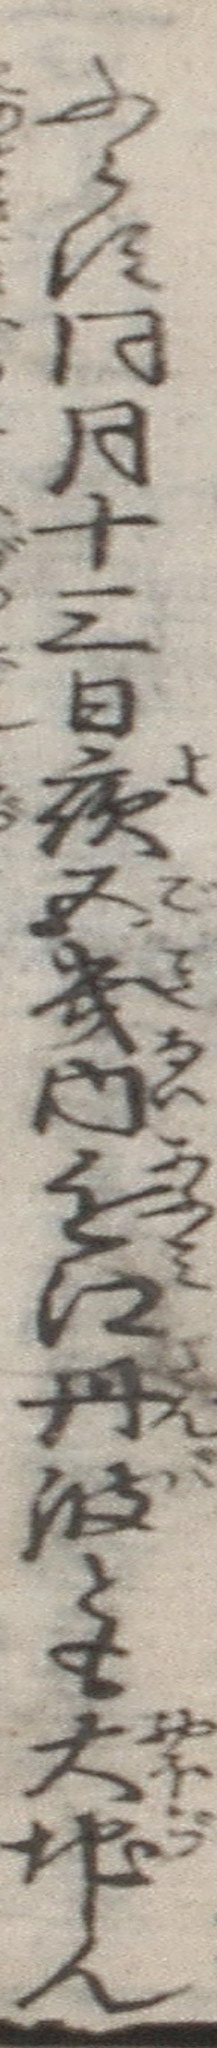ふらす同月十三日夜五畿内近江丹後とも大地しん
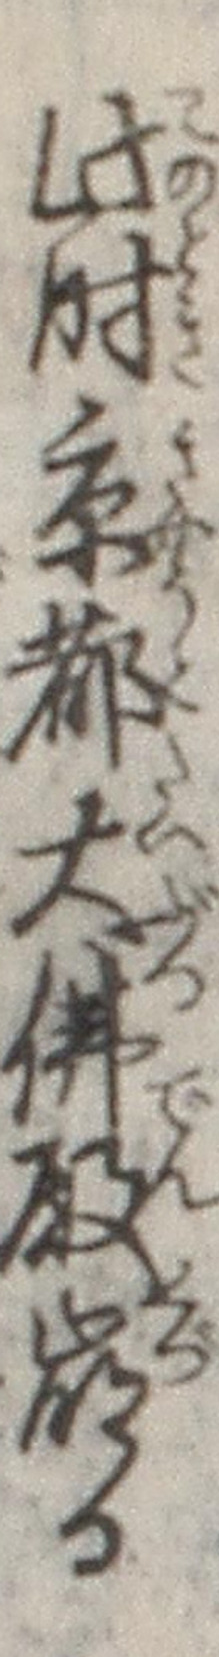此時京都大仏殿崩る
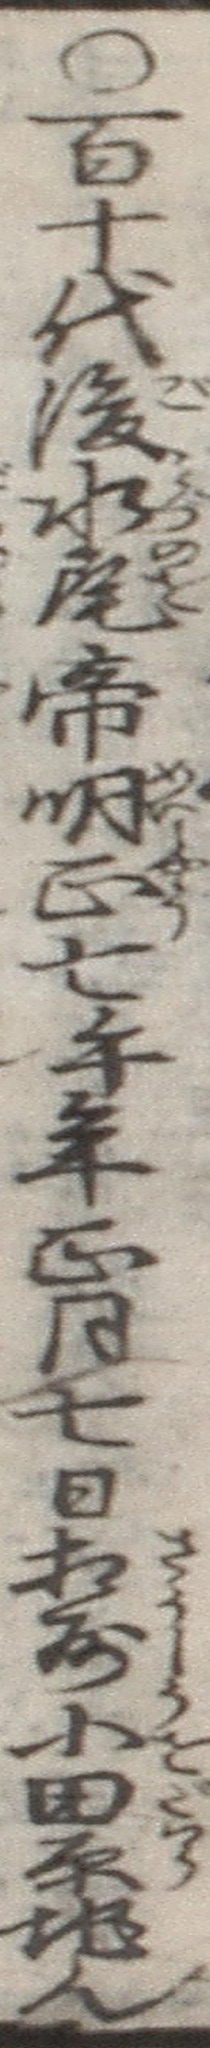○百十代後水尾帝明正七午年正月七日相州小田原地ん
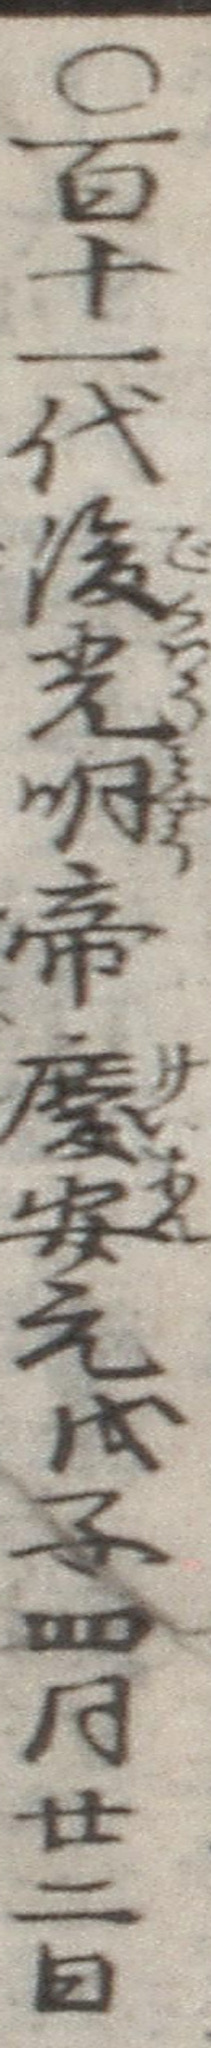○百十一代後光明帝慶安元戌子四月廿二日
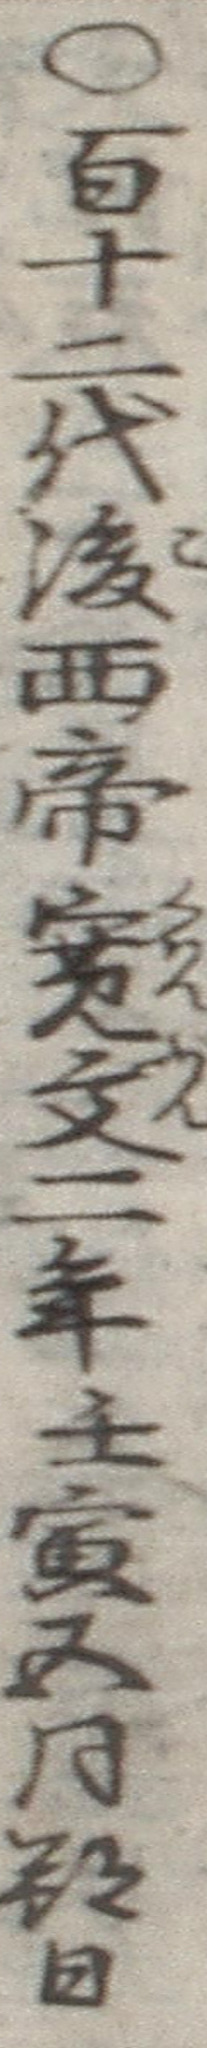○百十二代後西帝寛文二年壬寅五月朔日
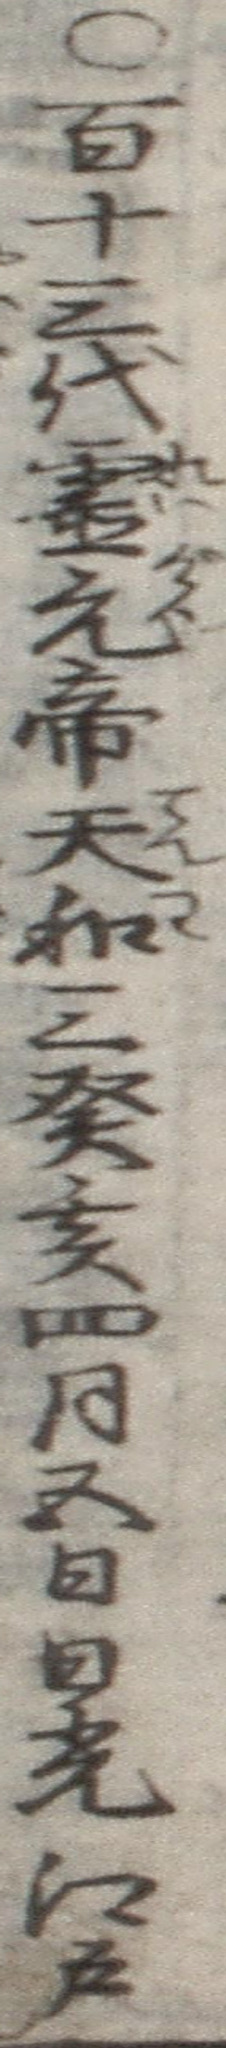○百十三代霊元帝天和三癸亥四月五日日光江戸
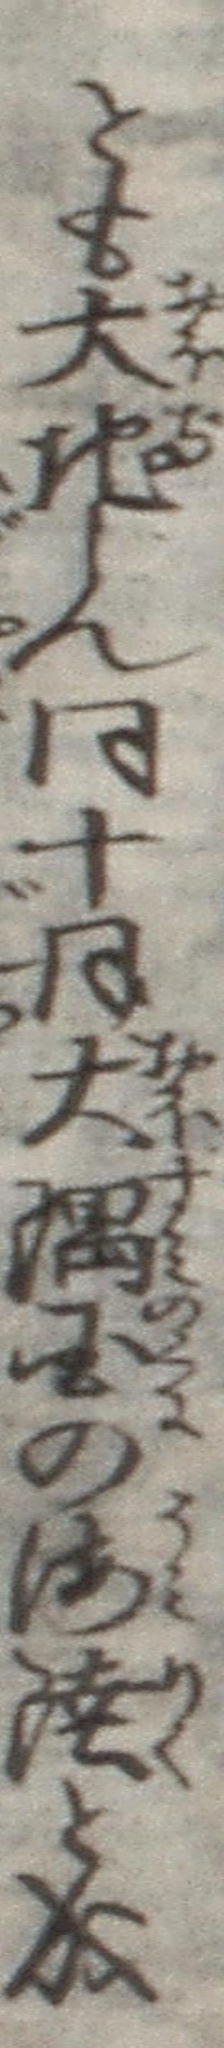とも大地しん同十月大隅国の海陸と成
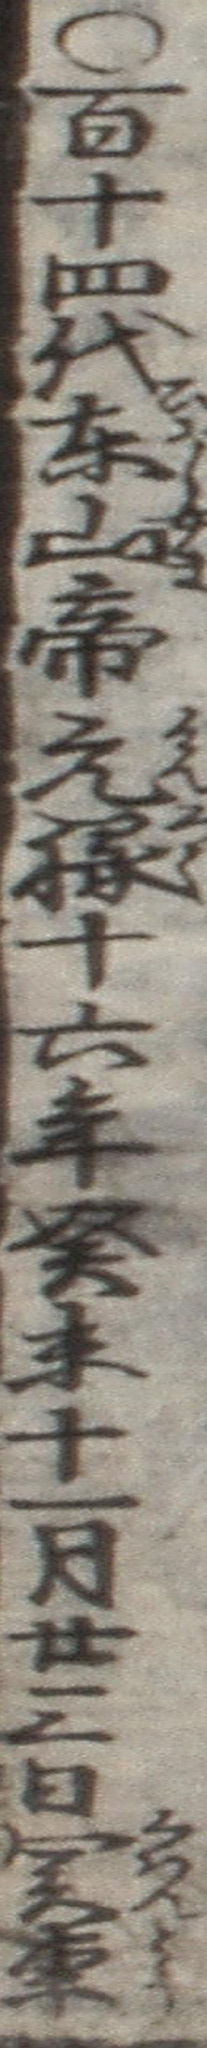○百十四代東山帝元禄十六年癸未十一月廿三日関東

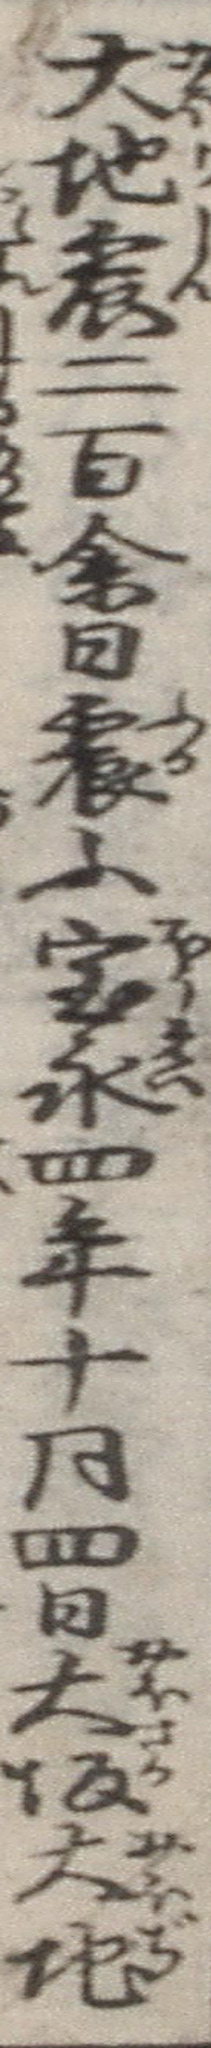大地震二百余日震ふ宝永四年十月四日大坂大地
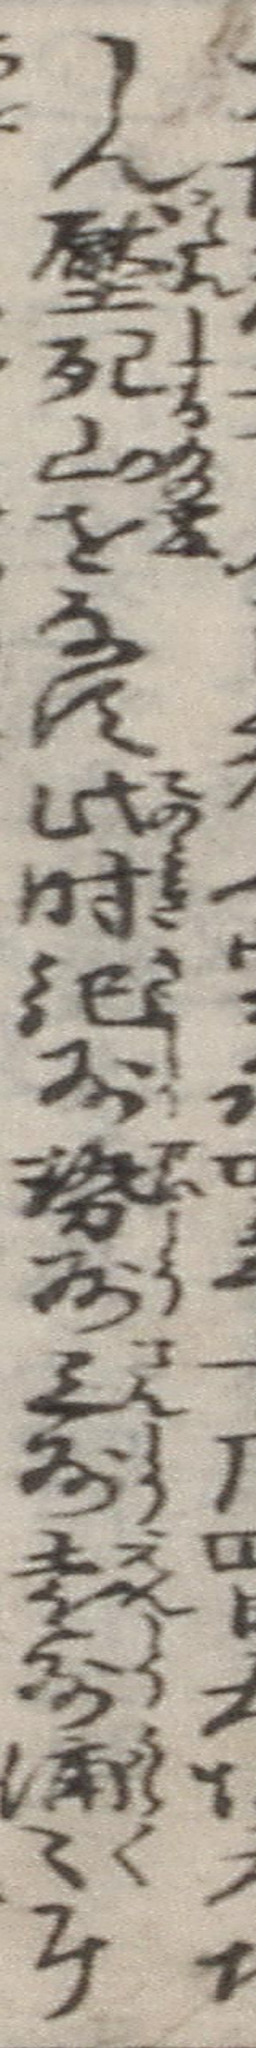しん圧死山をなす此時紀州勢州三州遠州浦々に
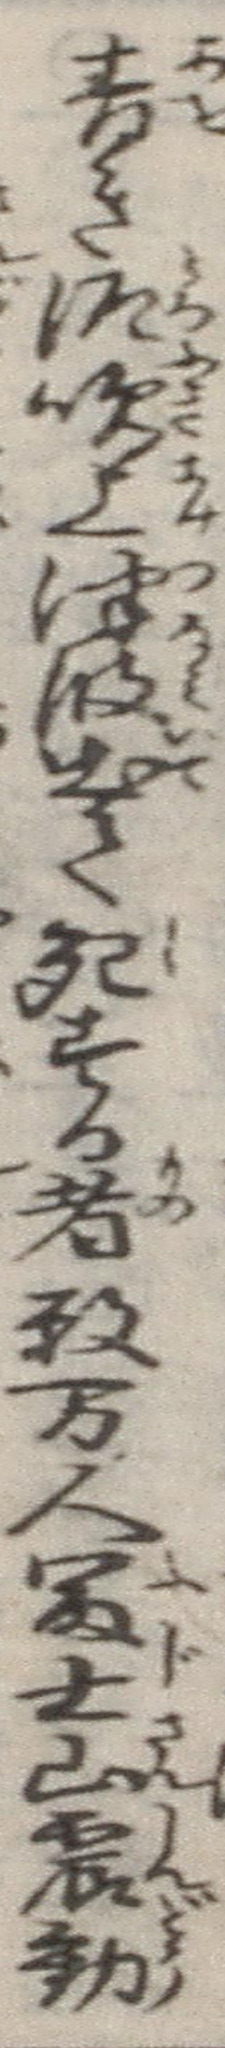青き泥吹上津波出て死する者数万人冨士山震動
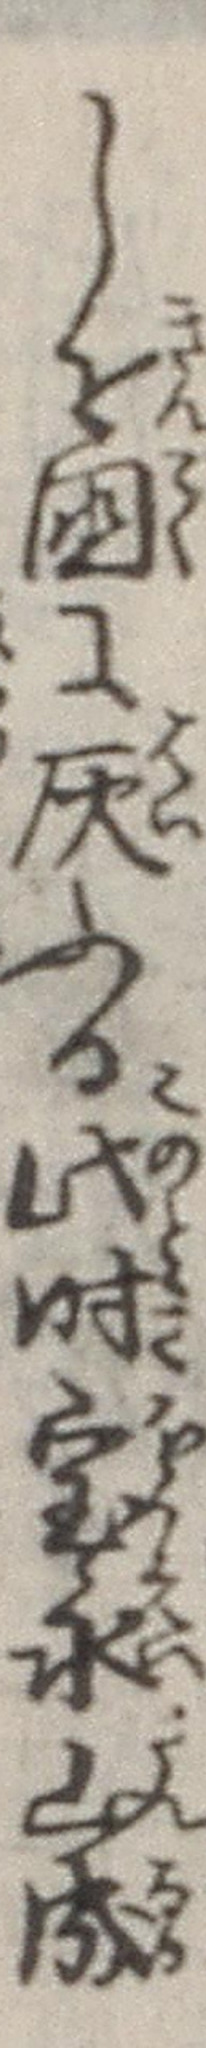し近国に灰ふる此時宝永山成
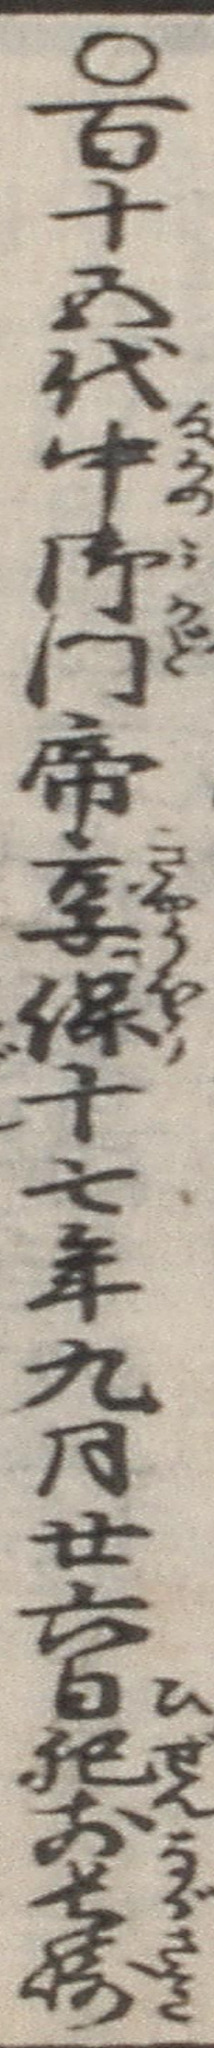○百十五代中御門帝享保十七年九月廿六日肥前長崎
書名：諸國大地震年代記　末代噺種
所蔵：東京大学地震研究所図書室 Earthquake Research Institute Library, The University of Tokyo, JAPAN
